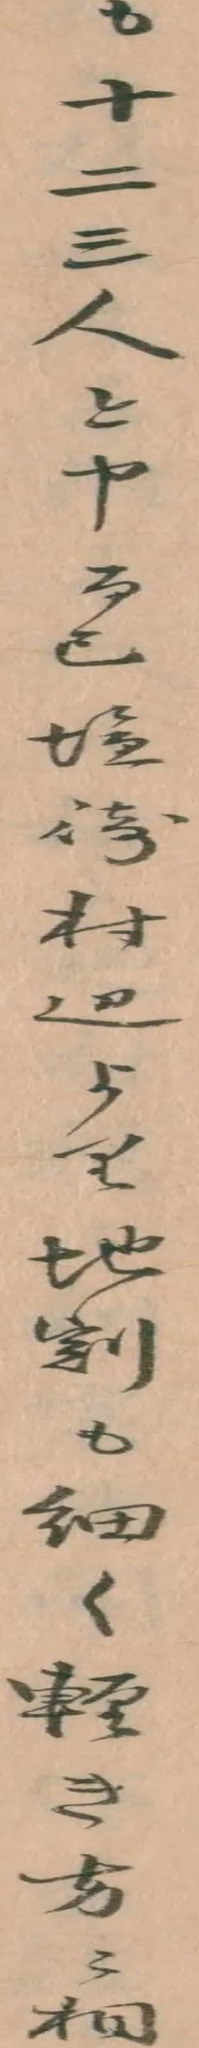も十二三人と申而已塩崎村辺より地割も細く軽き方ニ相
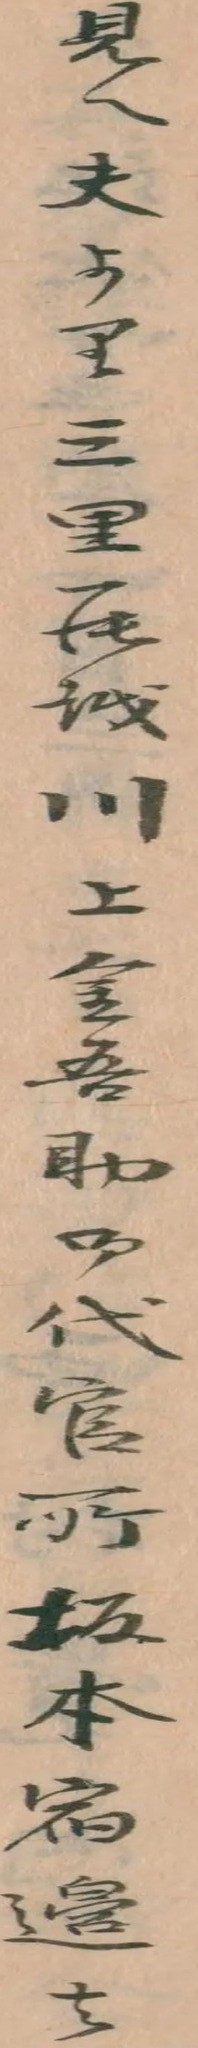見へ夫より三里罷越川上金吾助御代官所坂木宿辺者
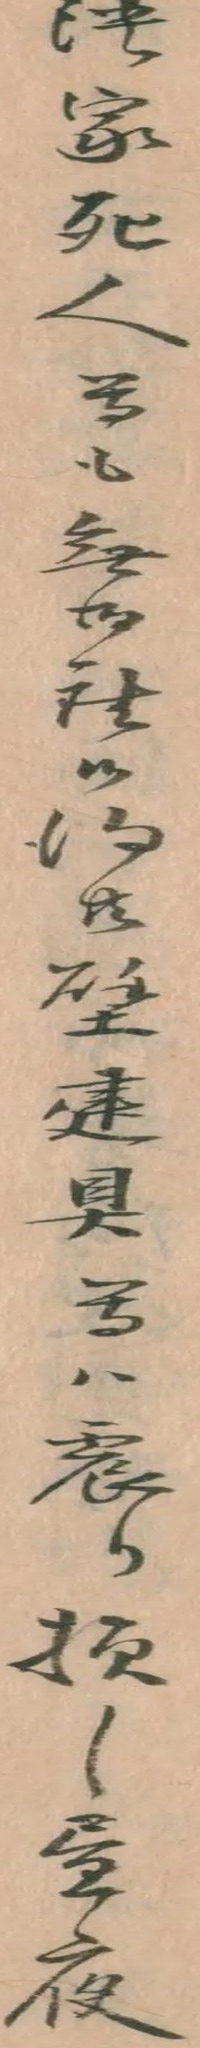潰家死人等も無御座候得共壁建具等は震り損し昼夜
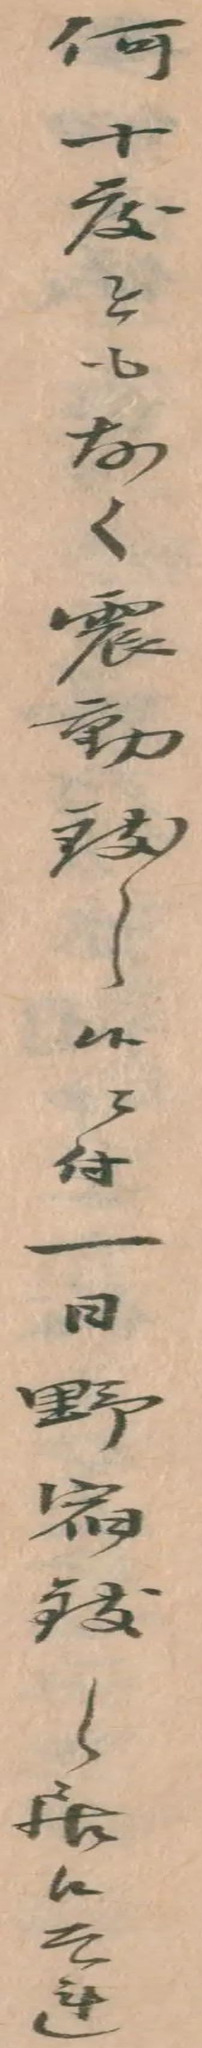何十度ともなく震動致し候二付一同野宿致し居候
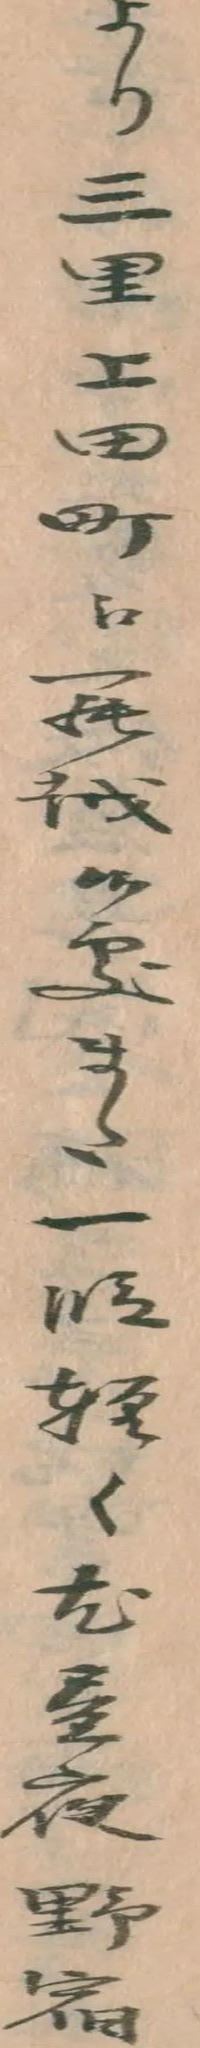それより三里上田町江罷越候処また一段軽く尤昼夜野宿
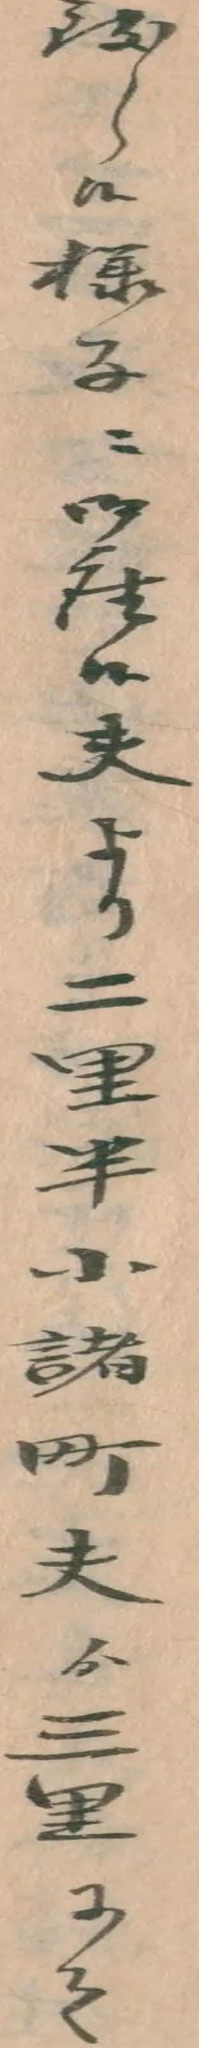居致し候候様子ニ御座候夫より二里半小諸町夫ゟ三里にて
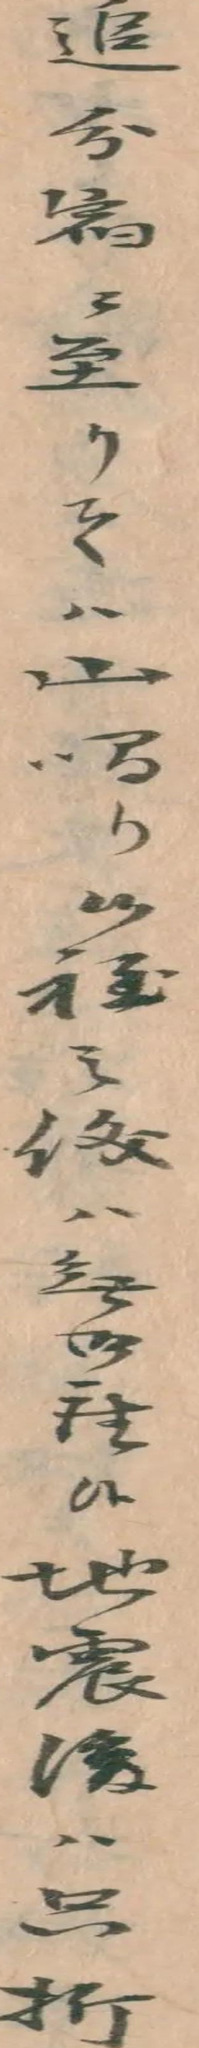追分宿ニ至りてハ山鳴候程之儀ハ無御座候地震後ハ只折

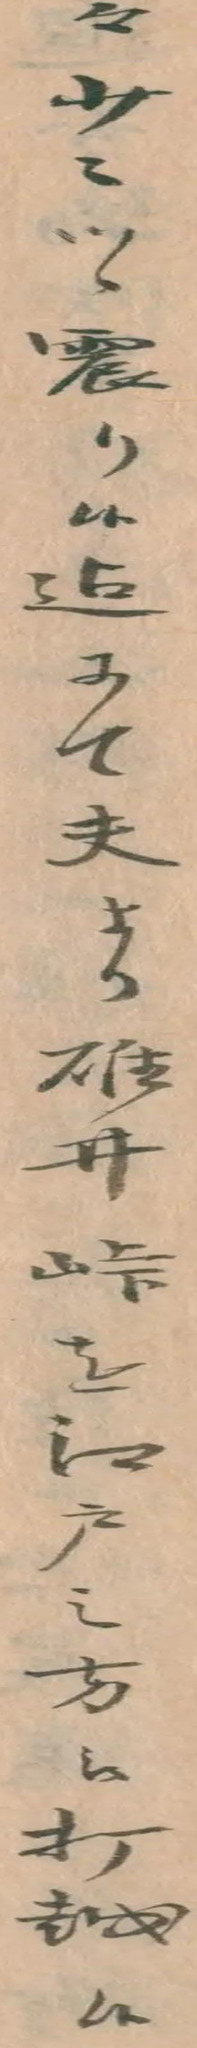々少々ツゝ震り候迄にて夫より碓水峠を江戸之方江打越候
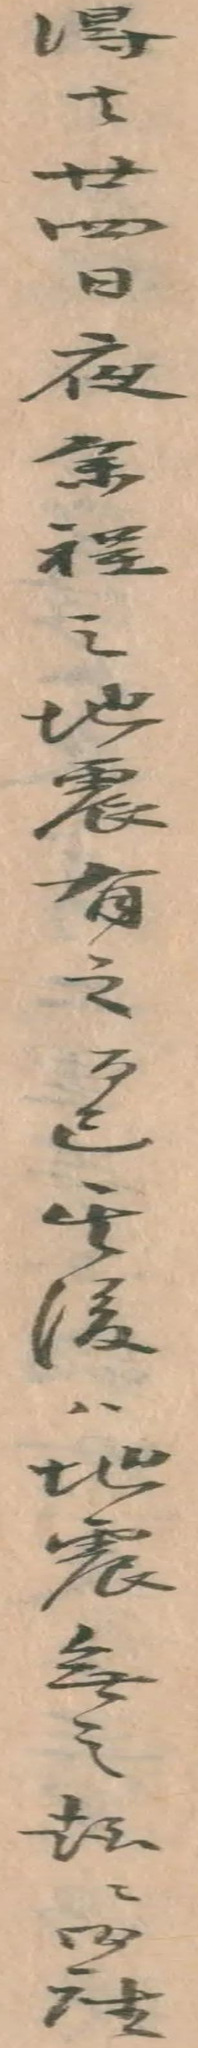得者廿四日夜余程之地震有之而已其後ハ地震無之趣ニ御座
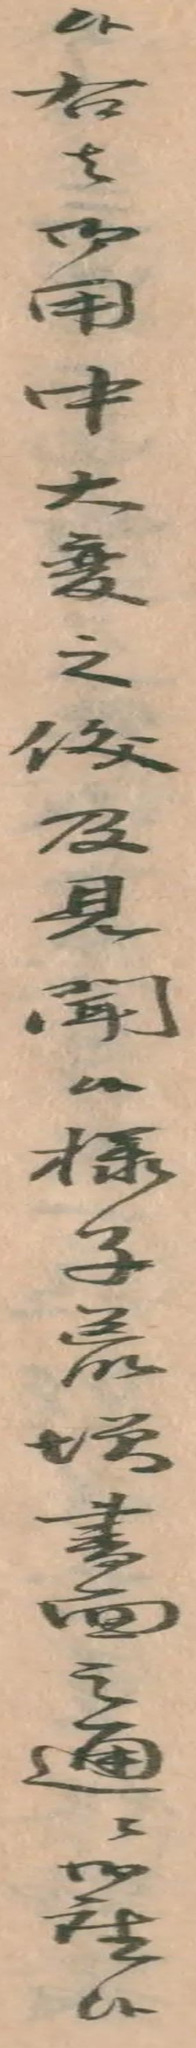候右者御用中大変之儀及見分候様子荒増書面之通ニ御座候
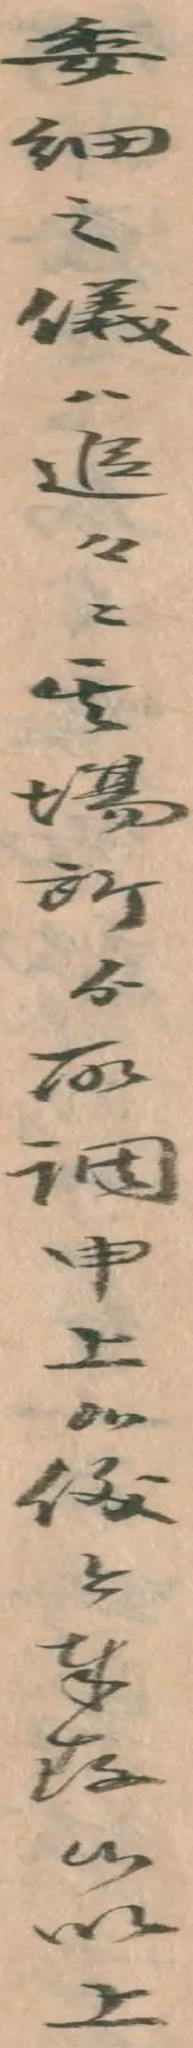委細之儀ハ追々二其場所ゟ取調申上候儀と奉存候以上
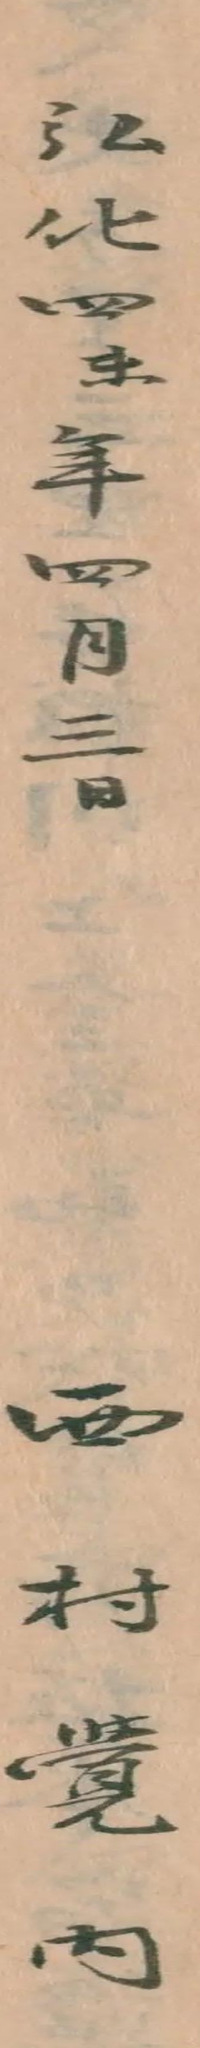弘化四未年四月三日御普請役見習
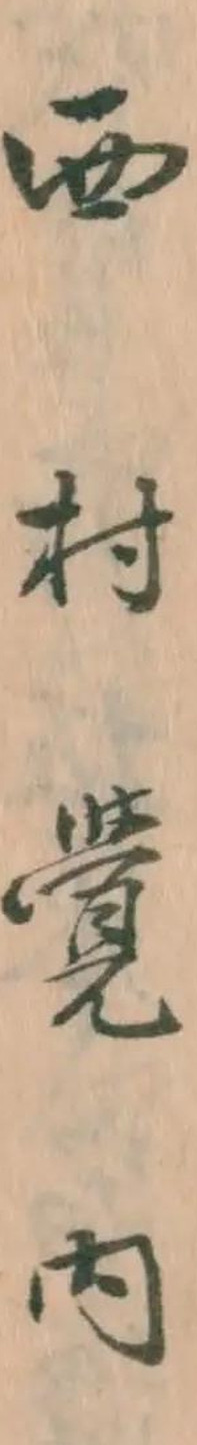西村覚内
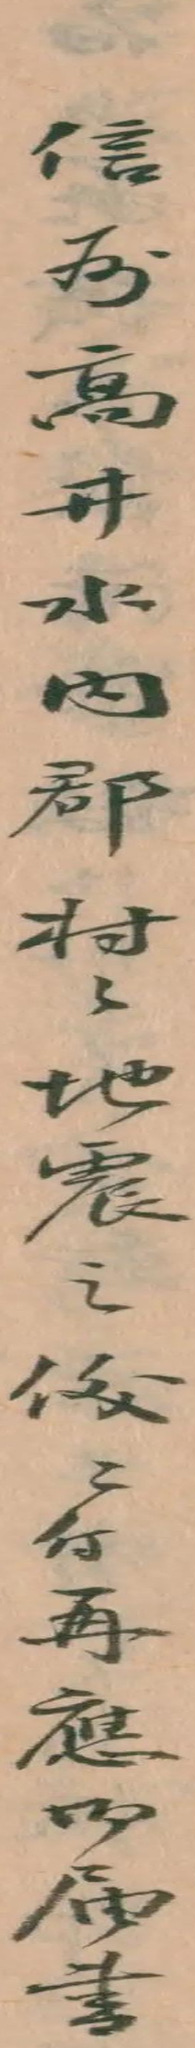信州高井水内郡村々地震之儀二付再応御届処
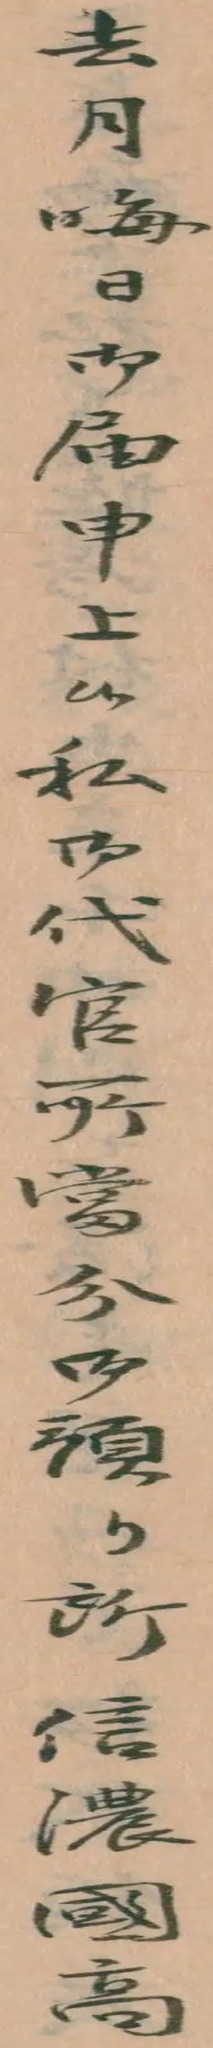去月晦日御届申上候私御代官所当分御預り所信濃国高
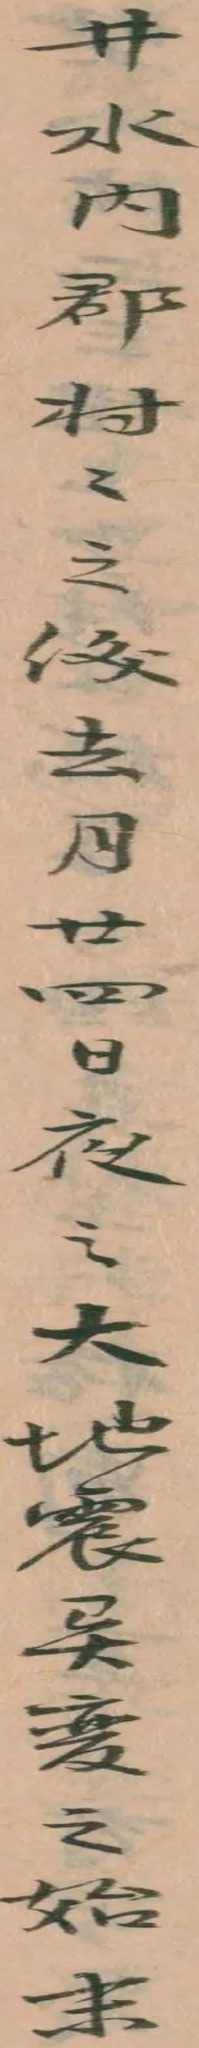井水内郡村々之儀去月廿四日夜之大地震異変之始末
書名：地災撮要. 巻3(地震之部)-巻4(噴火之部)
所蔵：国立国会図書館 National Diet Library, JAPAN
